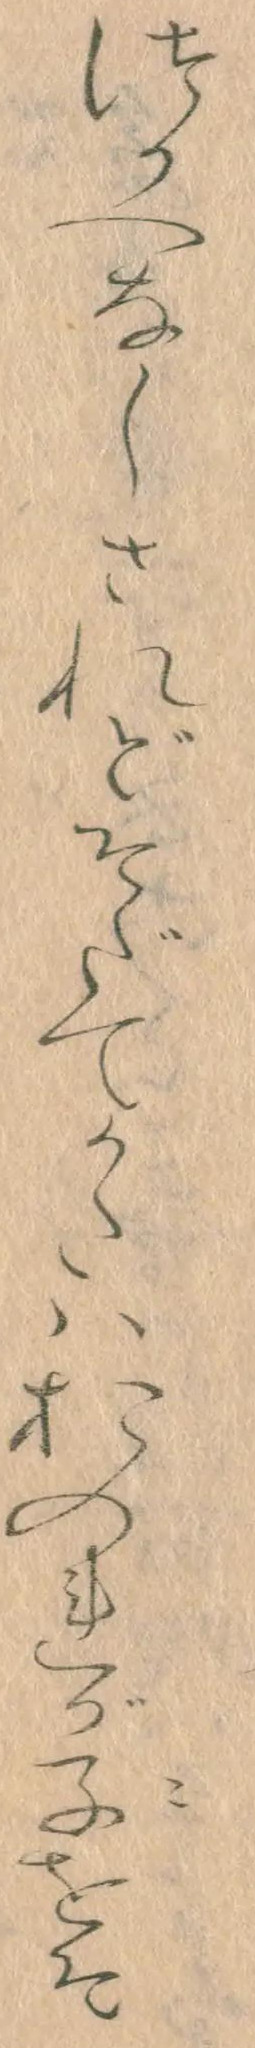つかへなしされどそだてかたはおのれが子をそ
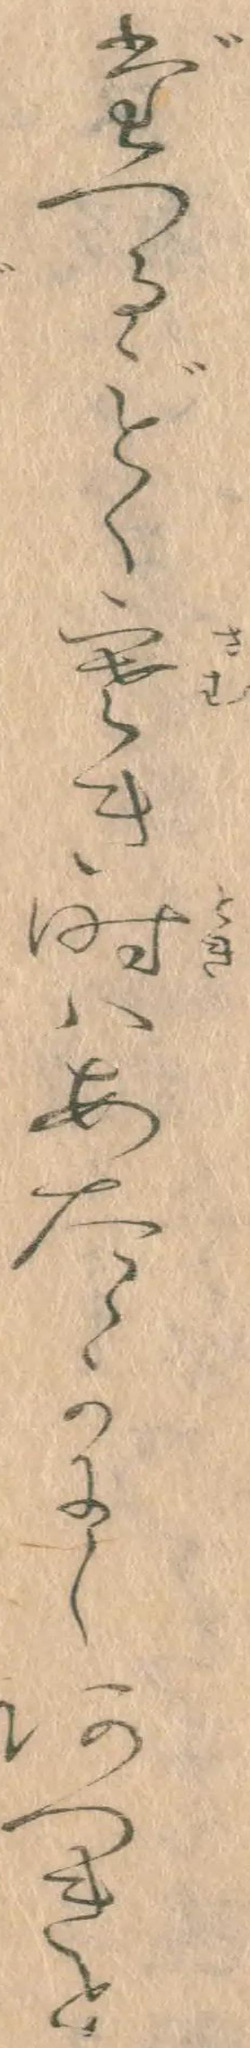だつるごとく寒き時はあたゝかにしあつきと
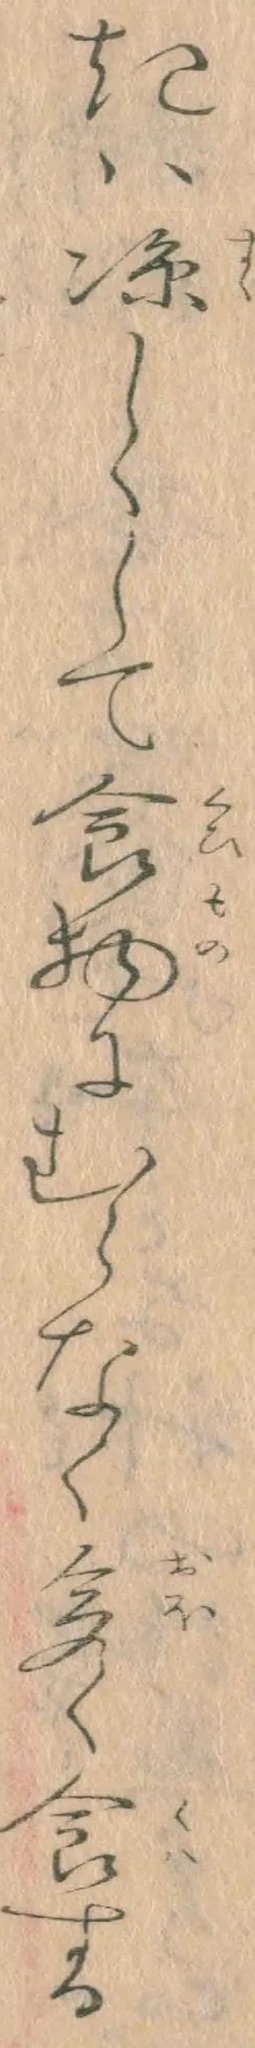きは涼しくして食物にむらなく多く食する
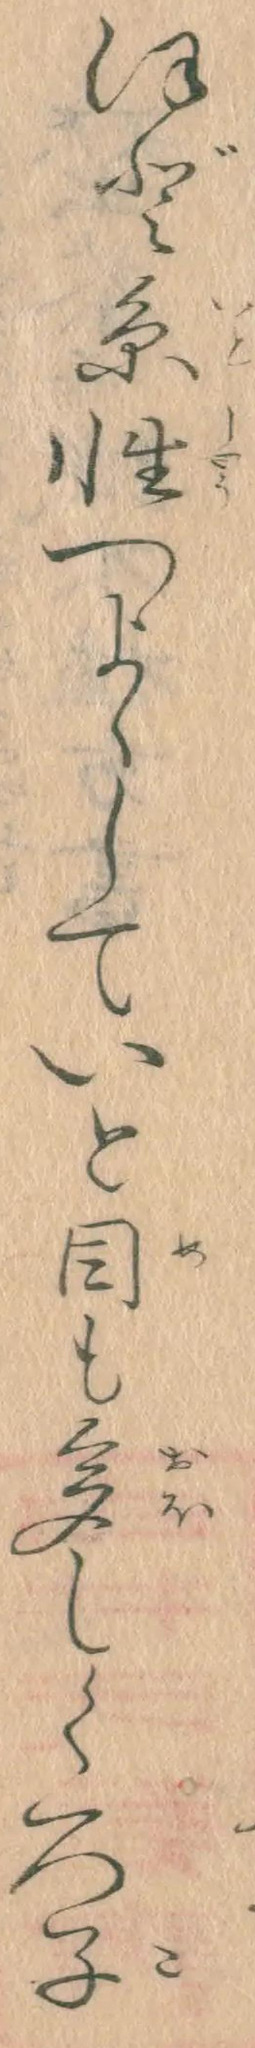ほど糸性つよくしていと目も多しくろ子
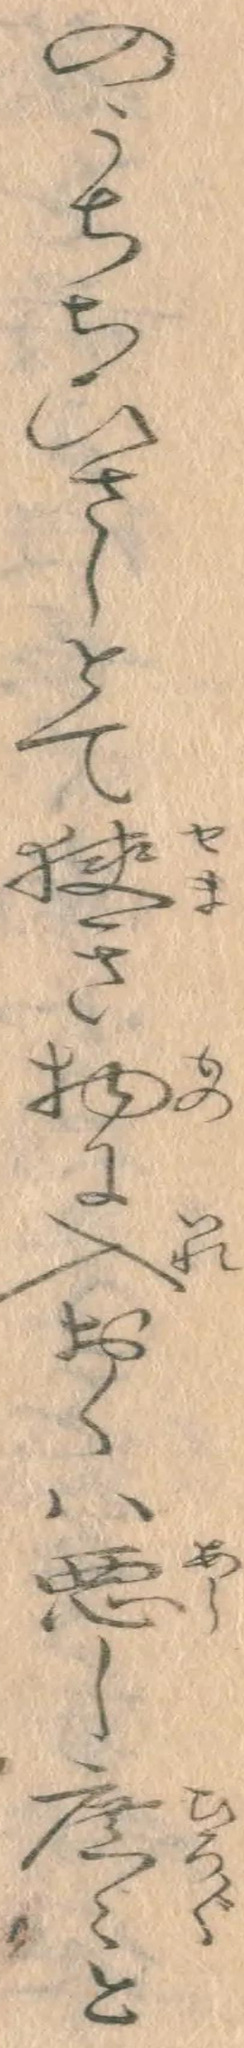のうちちひさしとて狭き物に入おくは悪し広々と
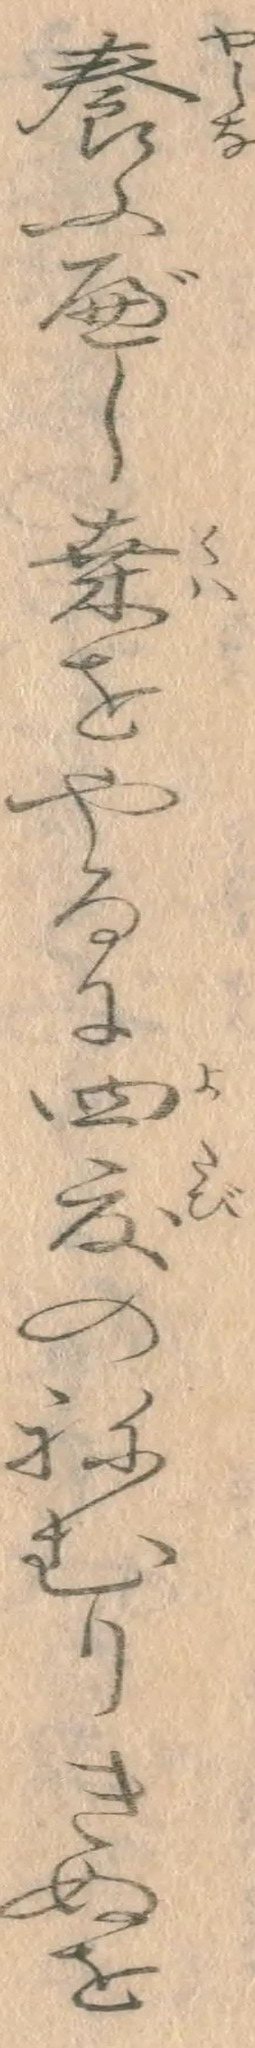養ふべし桑をやるに四度のねむりきぬを
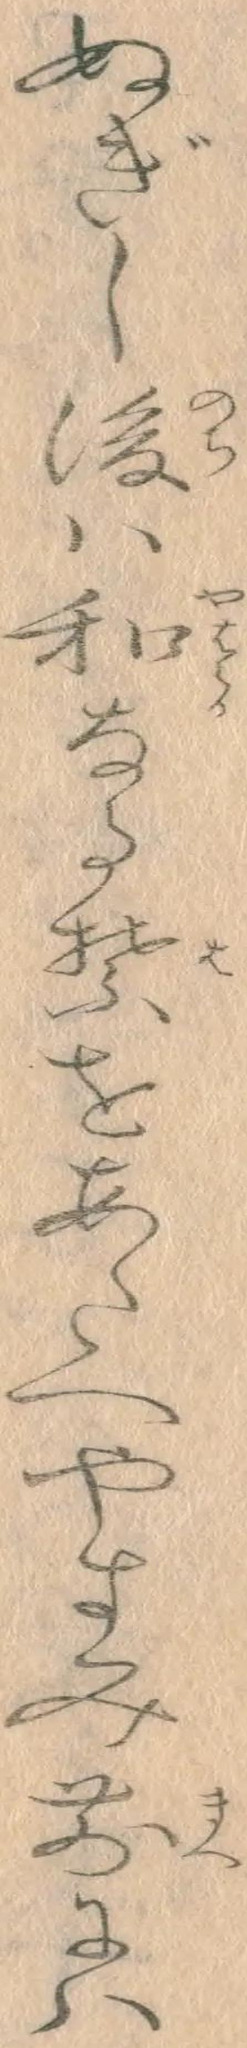ぬぎし後は和なる葉をあたへやすみ前には
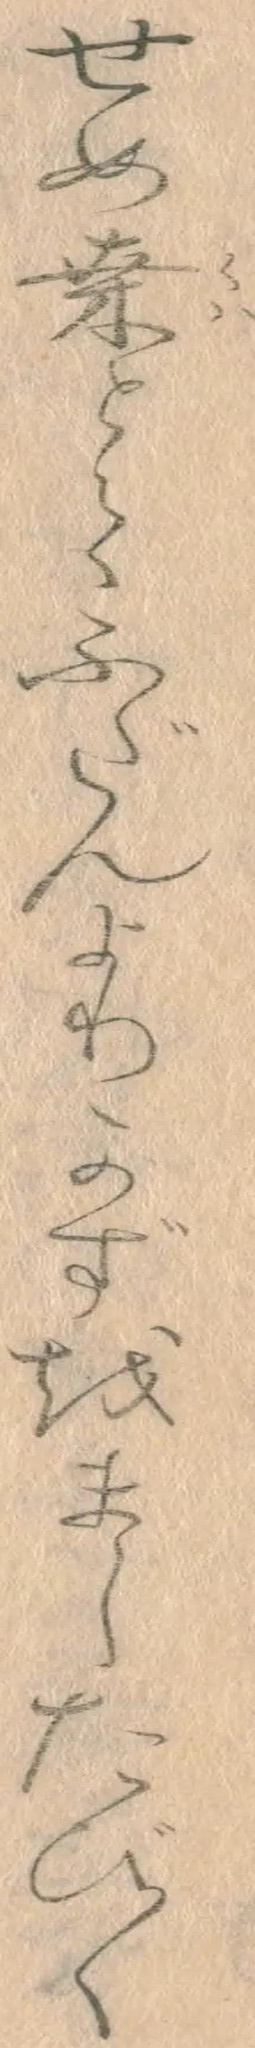せめ桑とてふだんよりかずをましたび〳〵
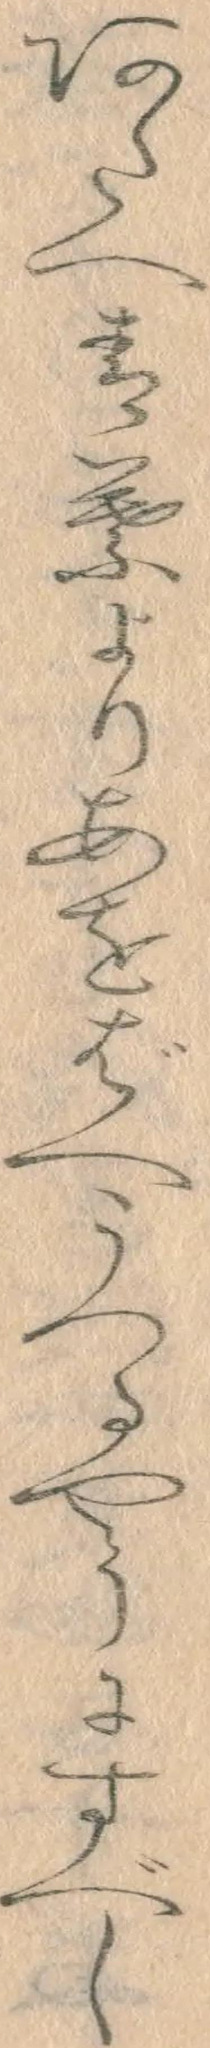あたへ青葉よりあをばへうつるやうにすべし
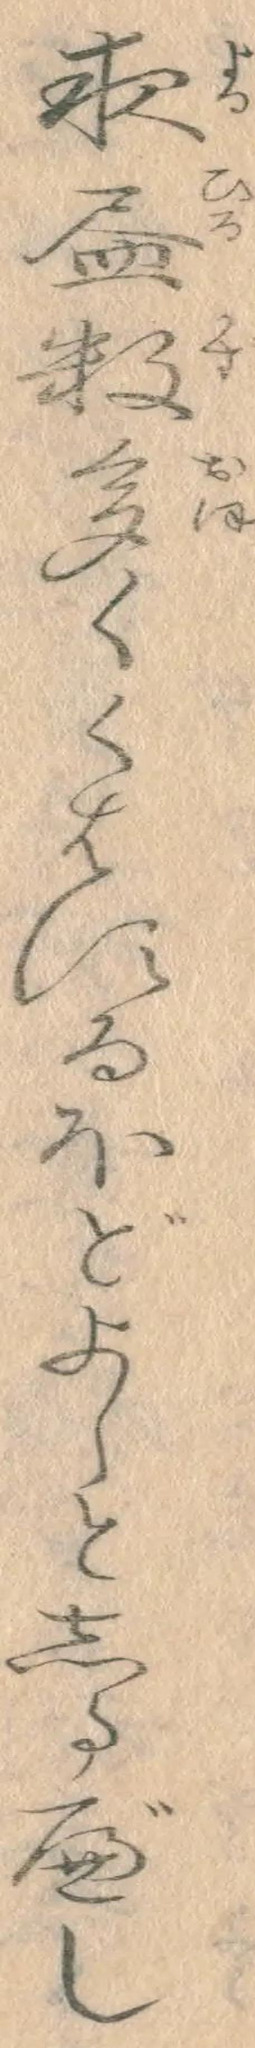夜昼数多くくはするほどよしとしるべし
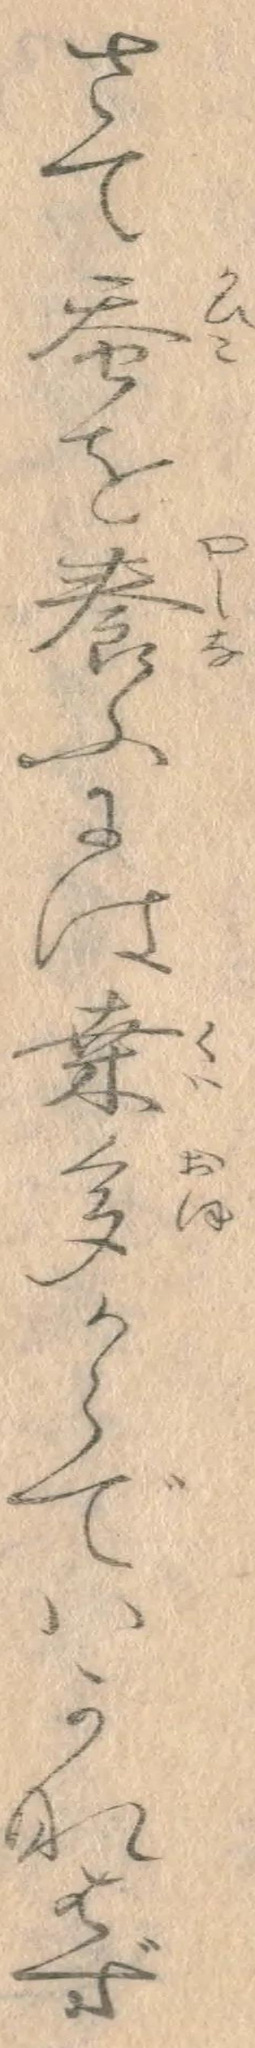さて蚕を養ふには桑多からではかなはず
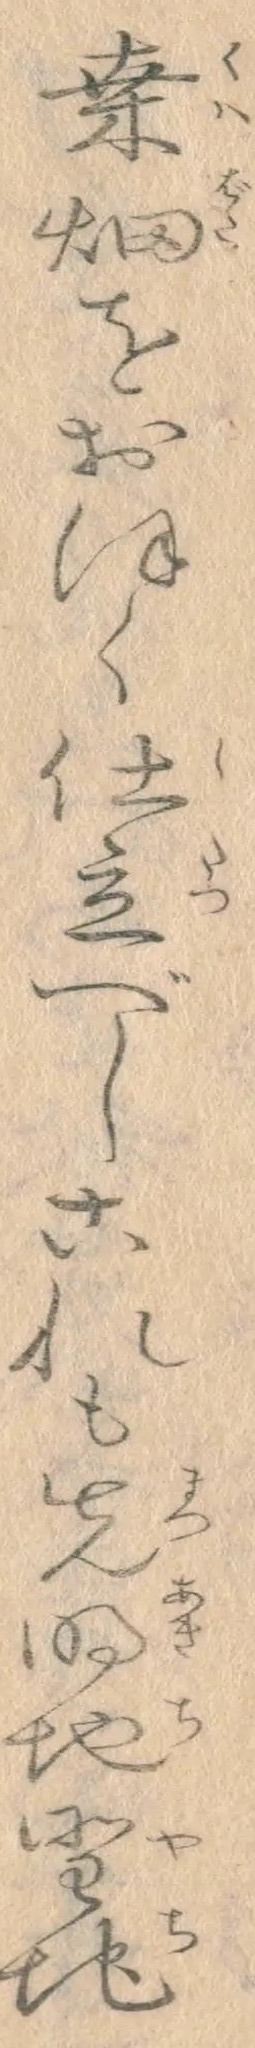桑畑をおほく仕立べしこれも先明地野地
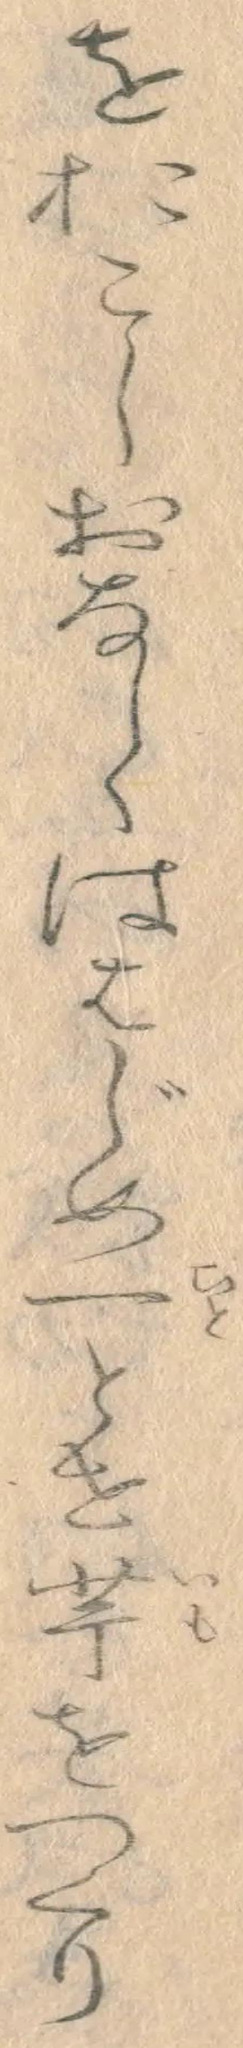をおこしおなしくははじめ一とせ芋をつくり
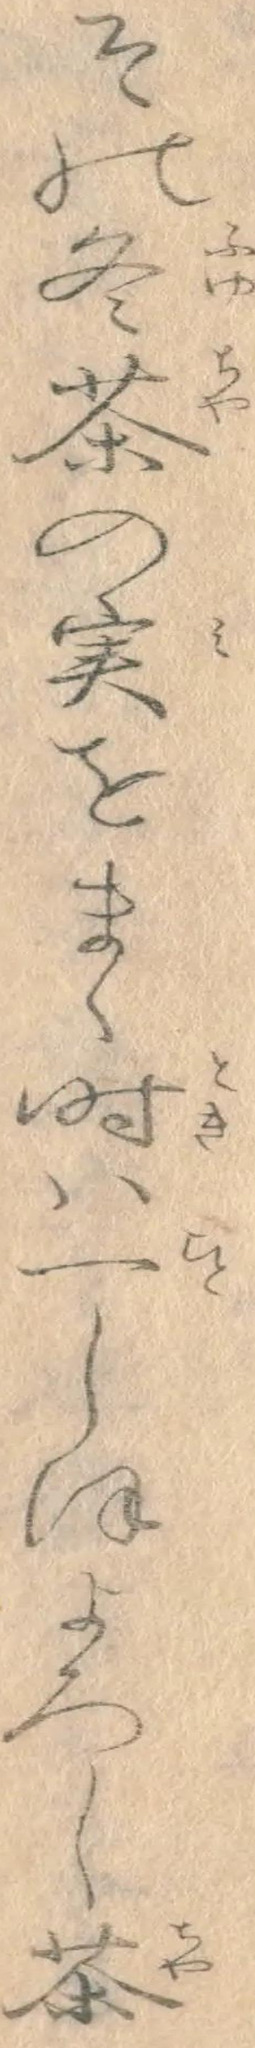その冬茶の実をまく時は一しほよろし茶

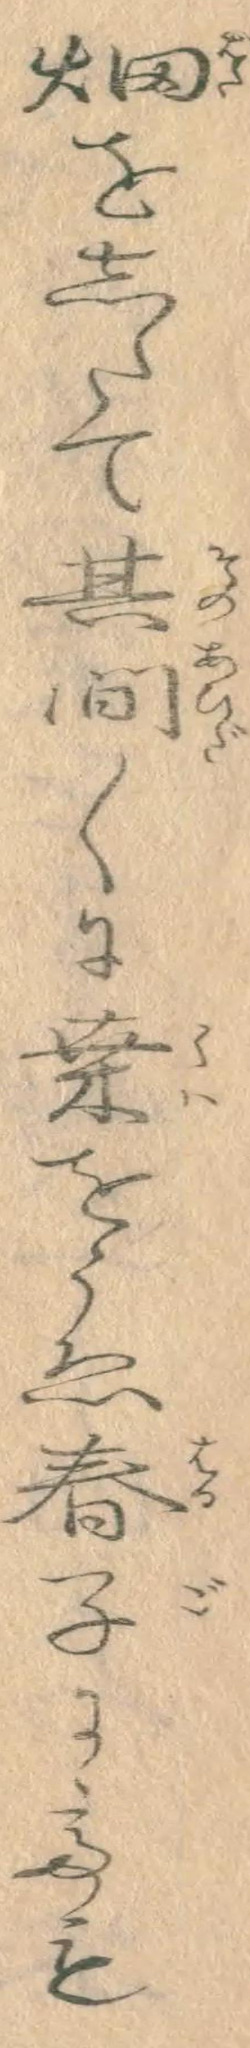畑をしたて其間〳〵に桑をうゑ春子にても
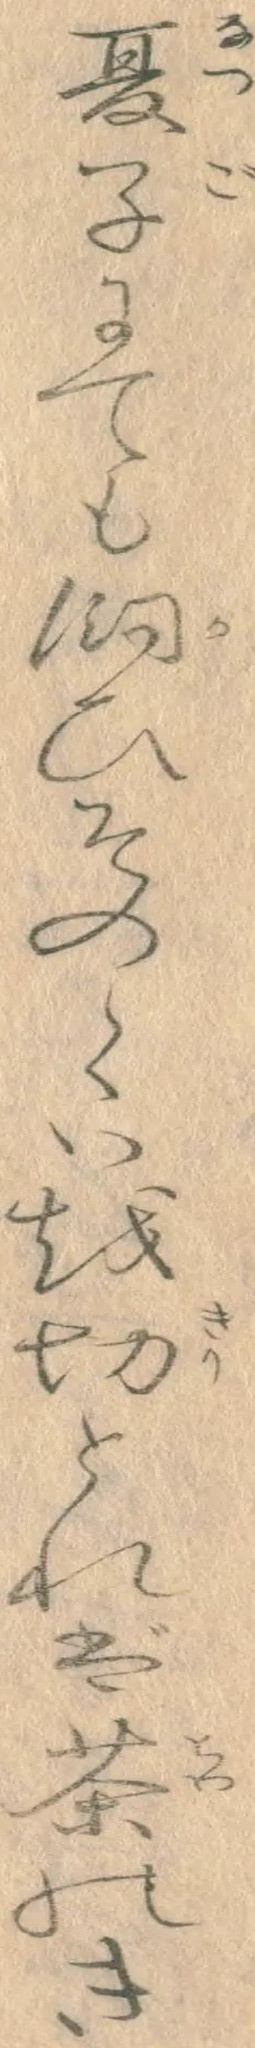夏子にても飼ひそのくはを切とれば茶のき
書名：蚕茶并紙木植方書
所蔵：国立国会図書館 National Diet Library, JAPAN
